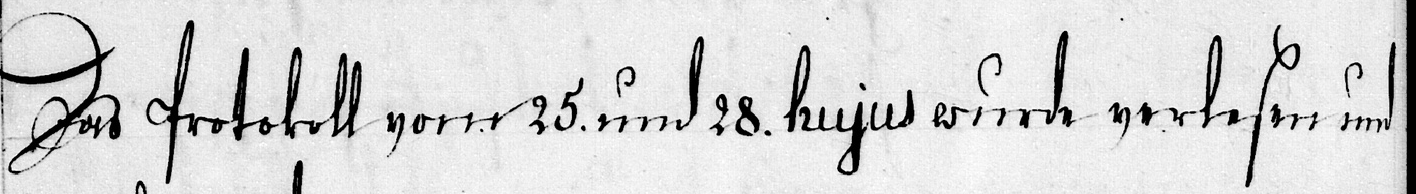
Das Protokoll vom 25. und 28. hujus wurde verlesen und
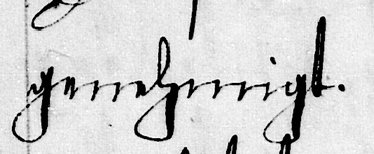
genehmigt.
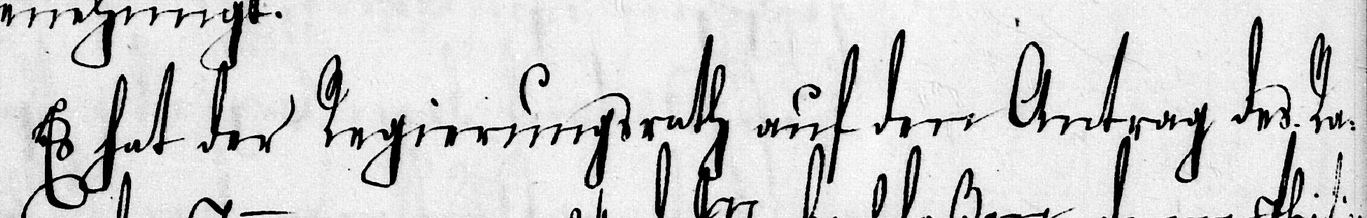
Es hat der Regierungsrath auf den Antrag des R¬
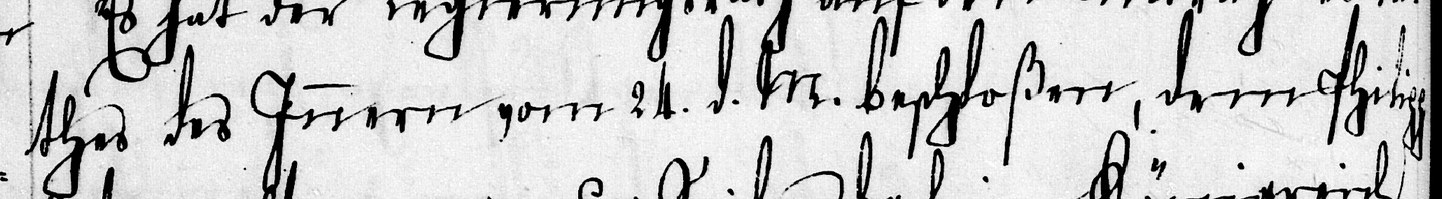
athes des Innern vom 24. d. M. beschloßen, dem Phili¬
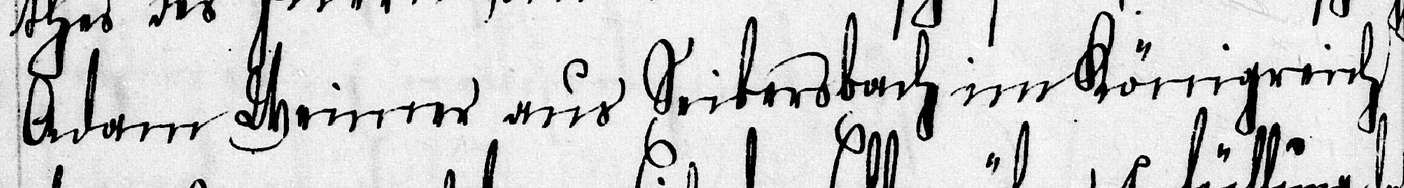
Adam Weimer aus Seibersbach im Königreich
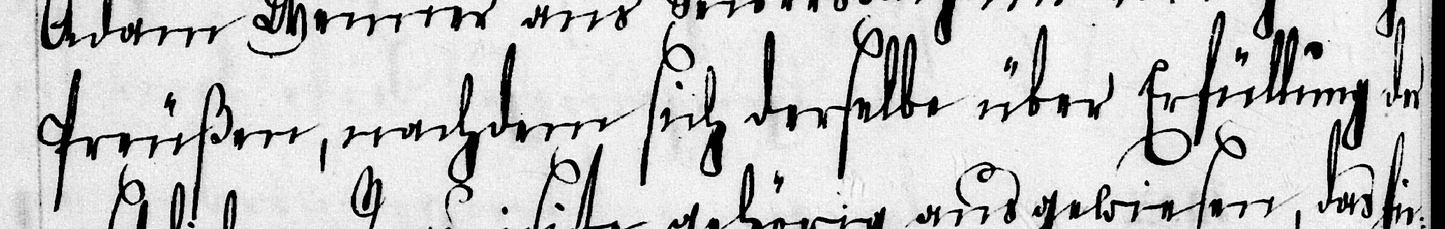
Preußen, nachdem sich derselbe über Erfüllung d¬
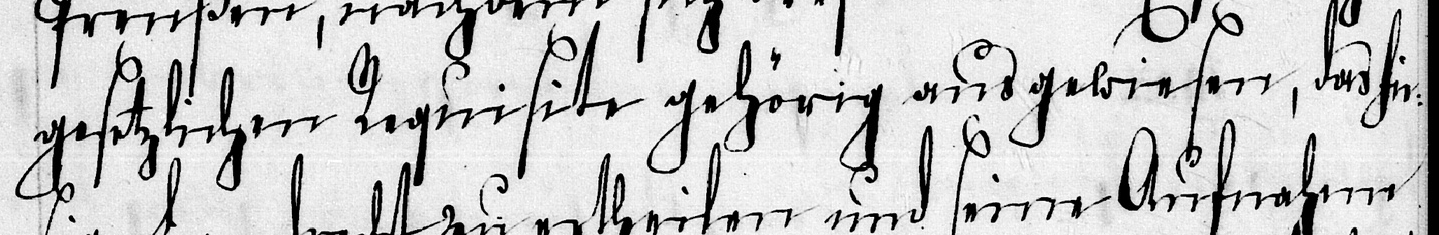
gesetzlichen Requisite gehörig ausgewiesen, das h¬
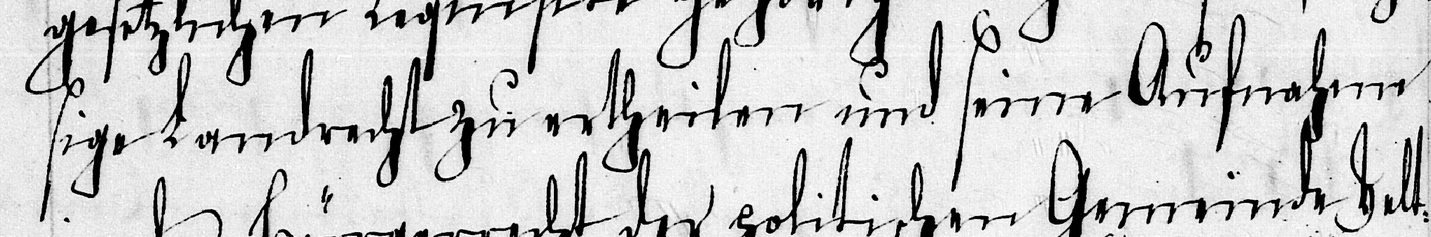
sige Landrecht zu ertheilen und seine Aufnahme
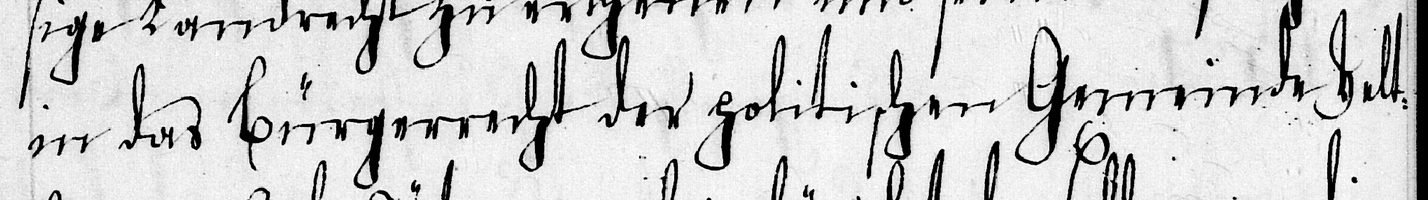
in das Bürgerrecht der politischen Gemeinde Vel¬
